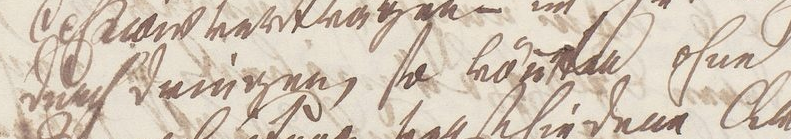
durchdringen, so könnten ohne
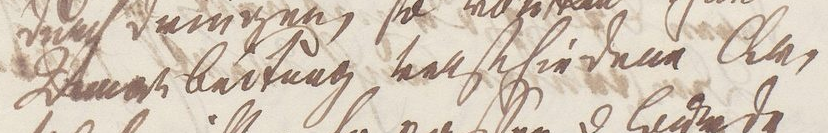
Umarbeitung verschiedene Ar-
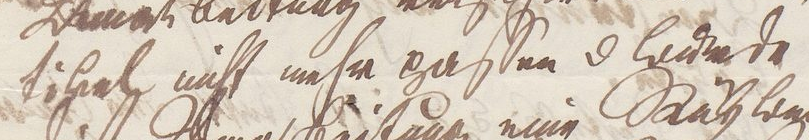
tikel nicht mehr passen & würde
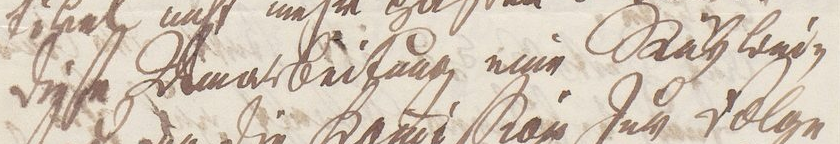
diese Umarbeitung eine Rükwei-
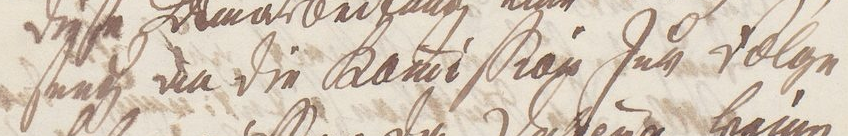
sung an die Kommission zur Folge
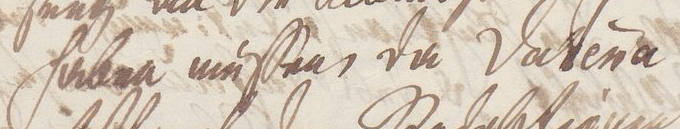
haben müssen, da Varenna keine
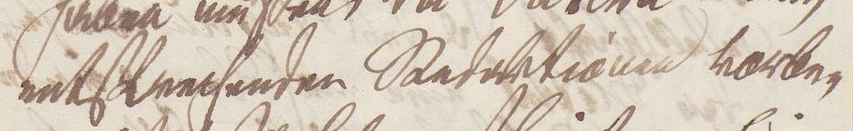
entsprechenden Redaktionen vorbe-
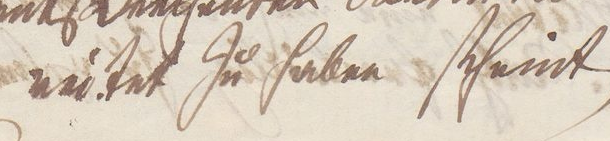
reitet zu haben scheint.
